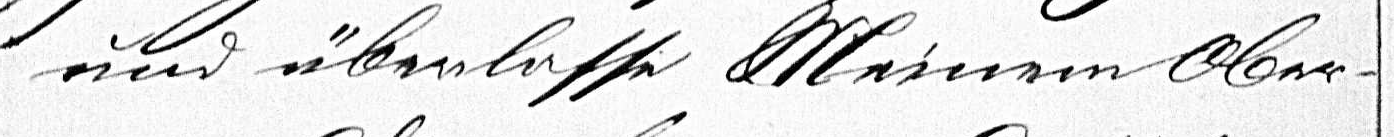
und üerlasse Meinem Ober¬
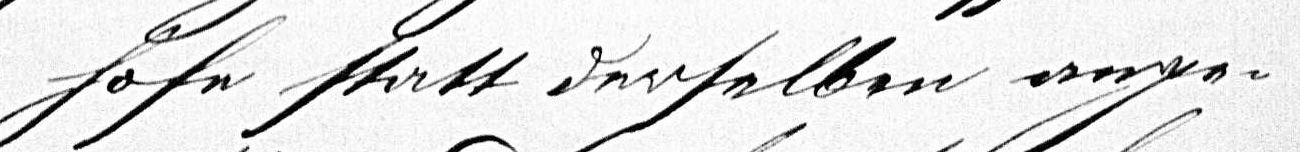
hofe statt derselben ange¬
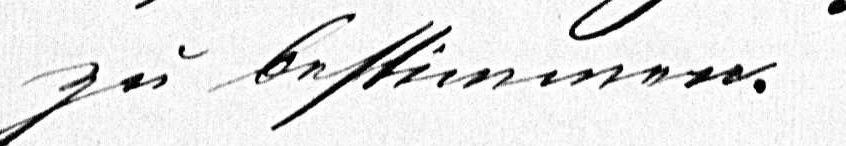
zu bestimmen.
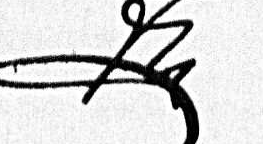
xx
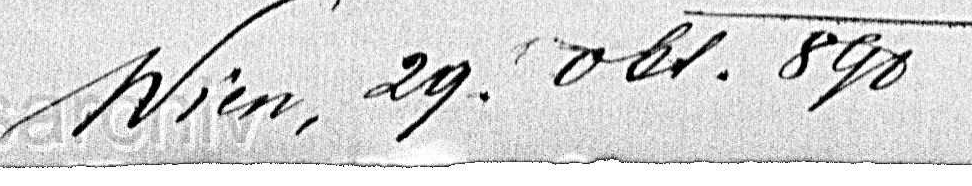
Wien, 29. Okt. 890
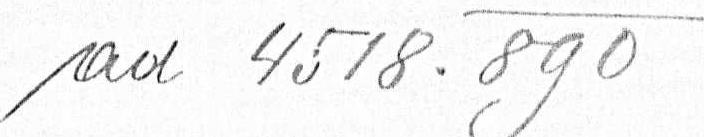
ad 4518. 890
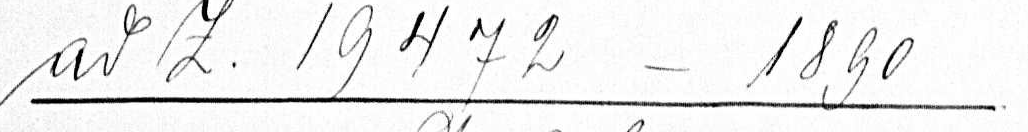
ad Z. 19472 - 1890
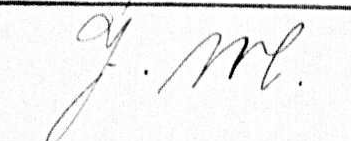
J. M.
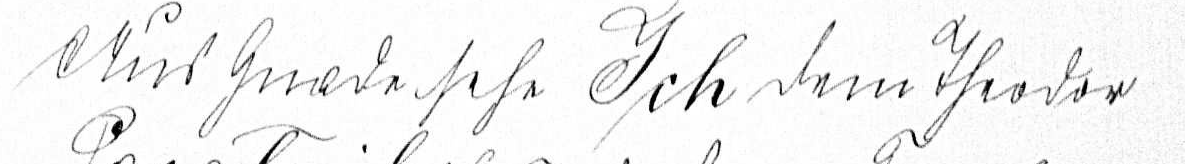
Aus Gnade sehe Jch dem Theodor
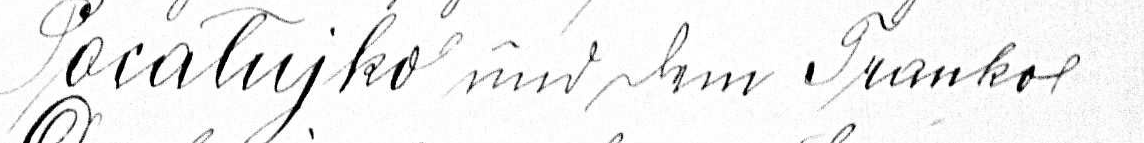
Pocatuiko und dem Franko
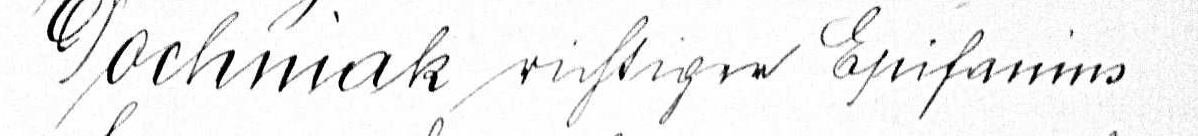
Dochniak richtiger Epifanius
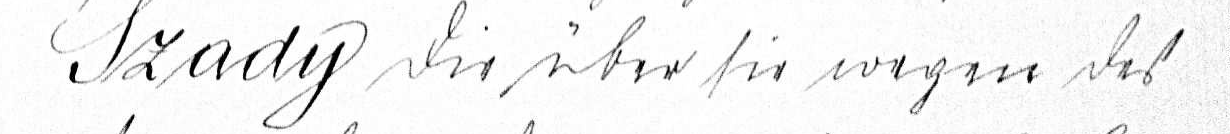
Szady die über sie wegen des
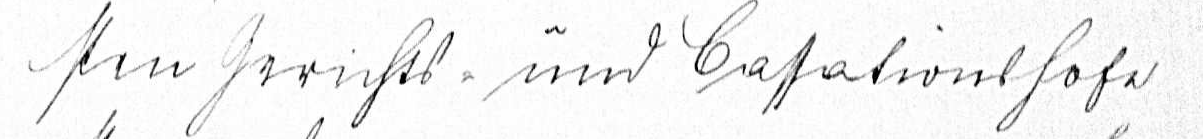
sten Gerichts= und Cassationshofe
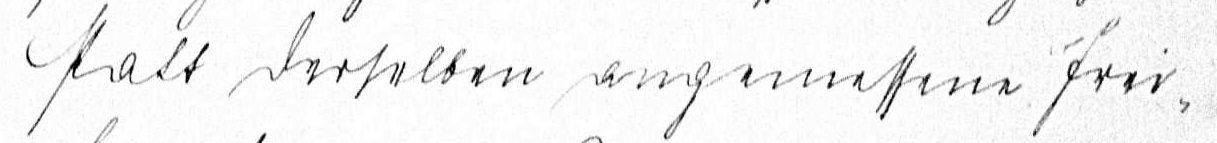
statt derselben angemessene Frei¬
